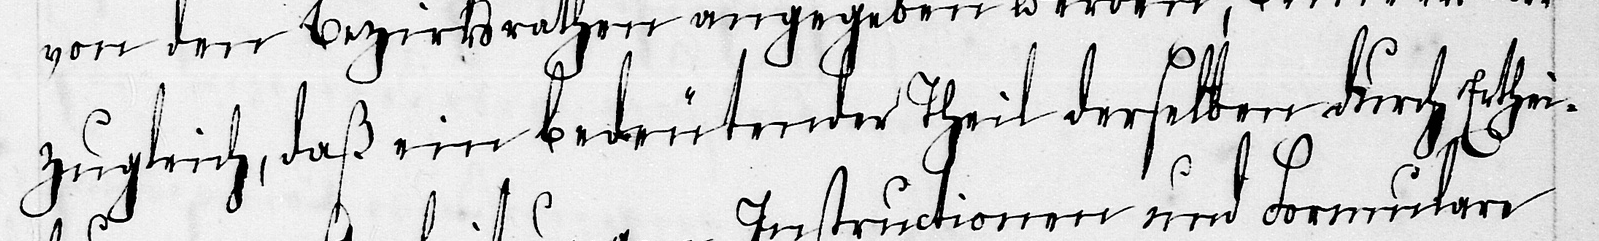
zugleich, daß ein bedeutender Theil derselben durch Erthei¬
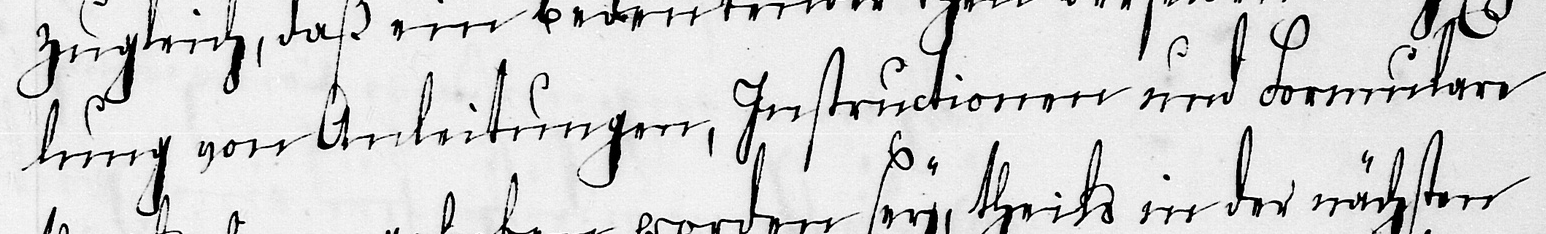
lung von Anleitungen, Instructionen und Formulare
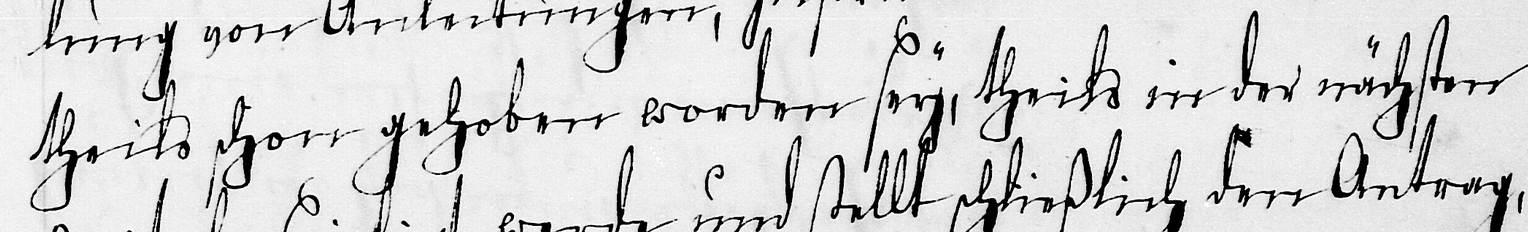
theils schon gehoben worden sey, theils in der nächsten
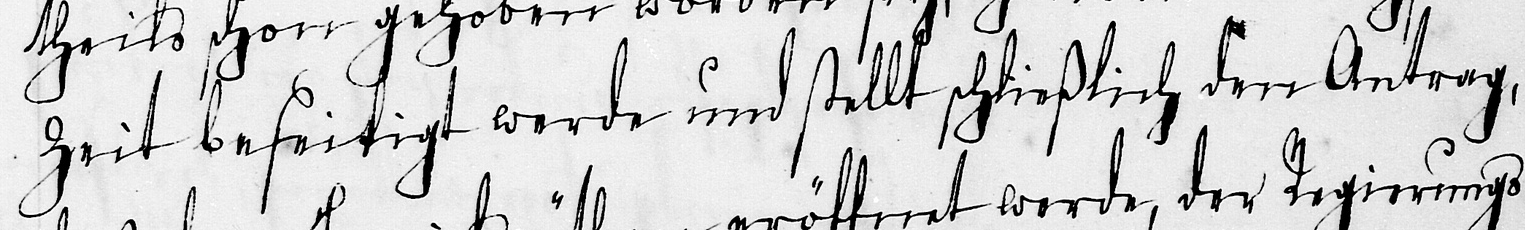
Zeit beseitigt werde und stellt schließlich den Antrag,
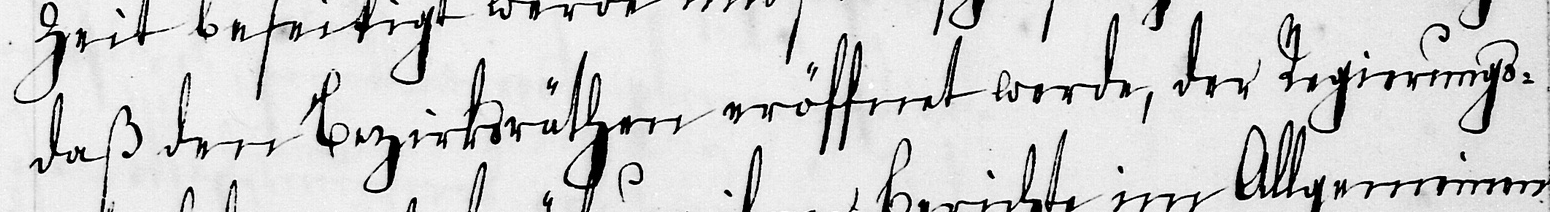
daß den Bezirksräthen eröffnet werde, der Regierungs¬
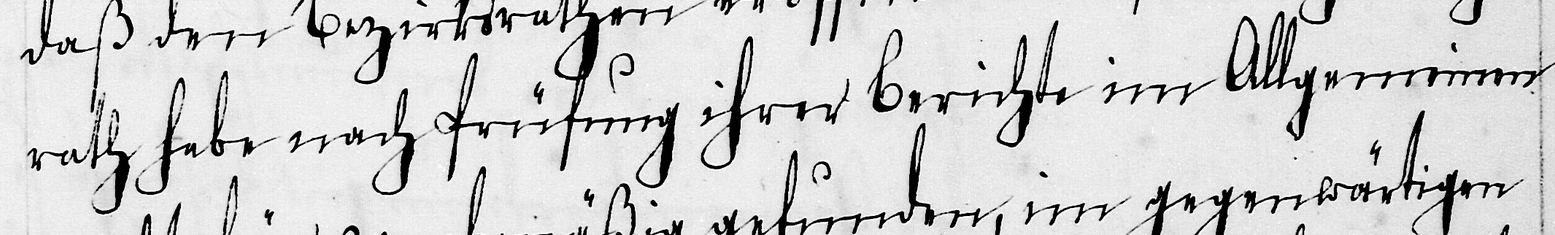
rath habe nach Prüfung ihrer Berichte im Allgemeinen
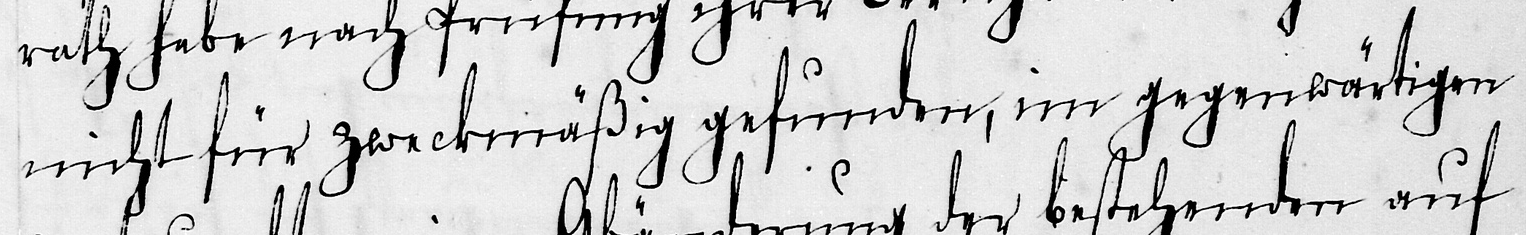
nicht für zweckmäßig gefunden, im gegenwärtigen
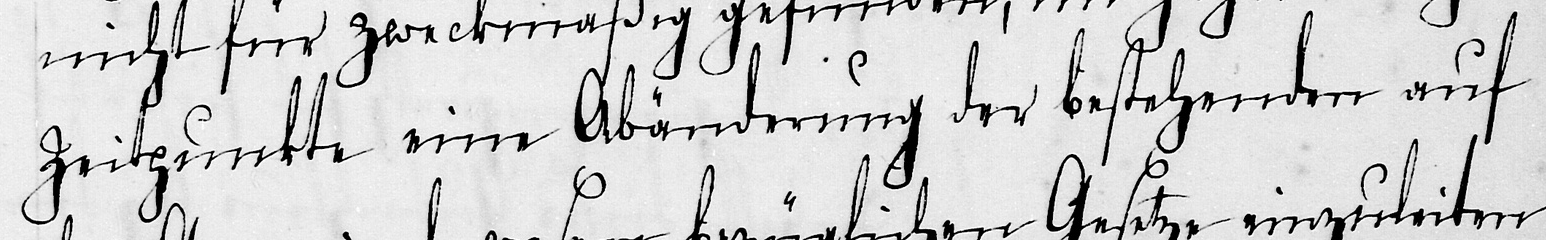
Zeitpunkte eine Abänderung der bestehenden auf
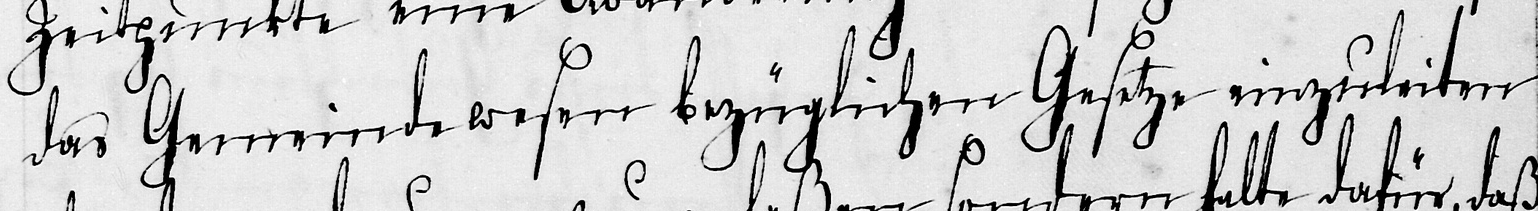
das Gemeindewesen bezüglichen Gesetze einzuleiten
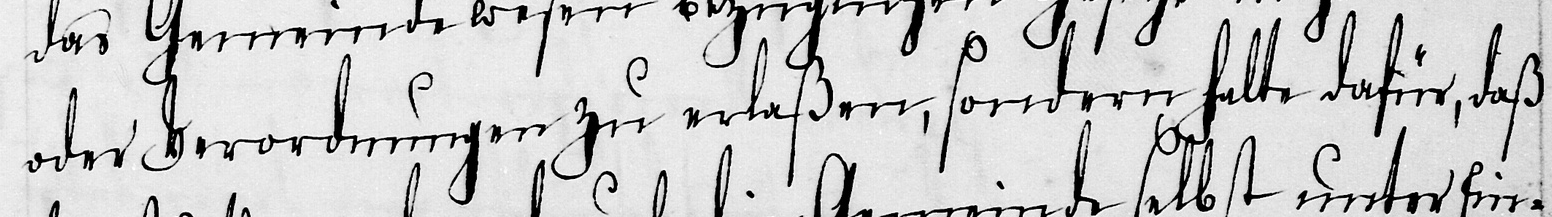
oder Verordnungen zu erlaßen, sondern halte dafür, daß
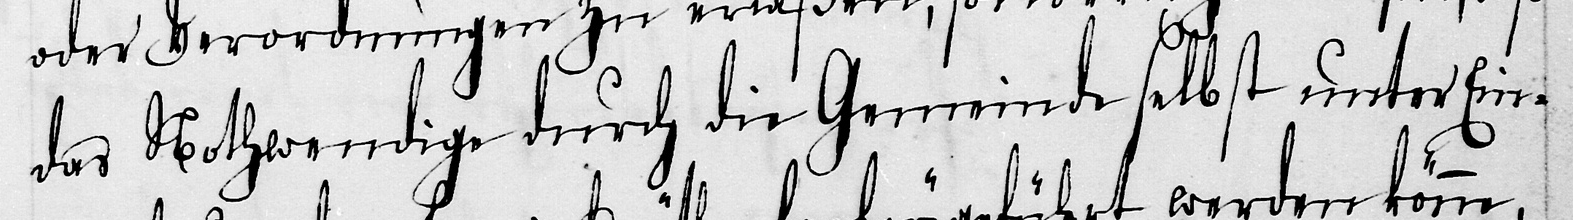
das Nothwendige durch die Gemeinde selbst unter Ein¬
